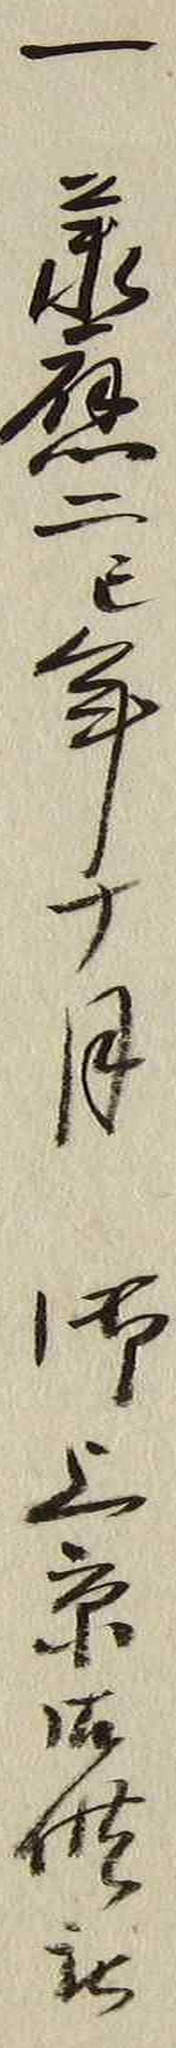一承応二巳年十月御上京御供被
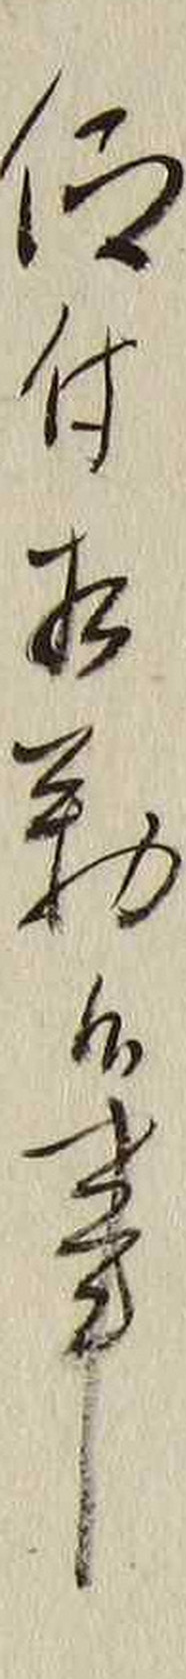仰付相勤候事
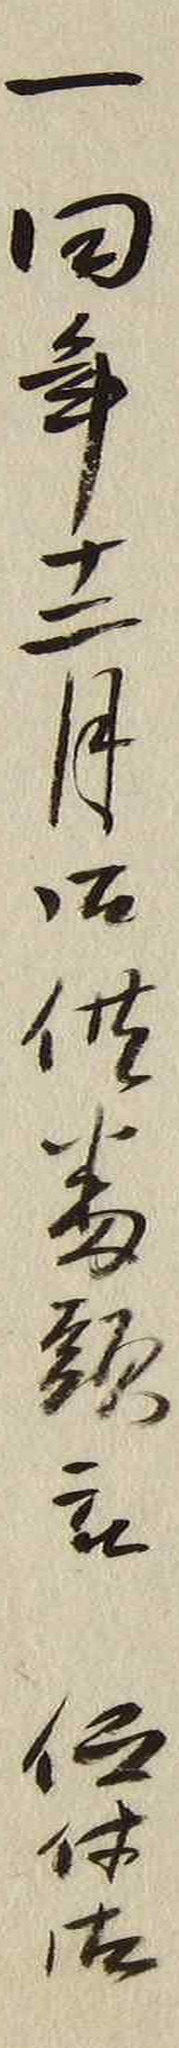一同年十二月御供番頭被仰付御
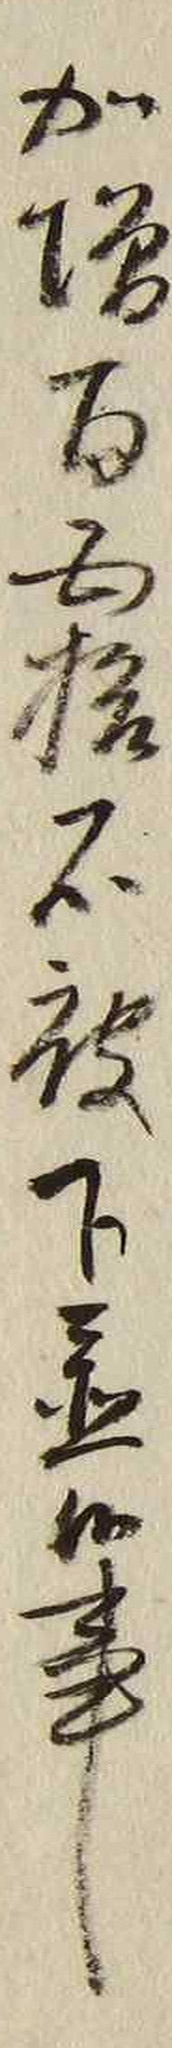加増百五拾石被下置候事

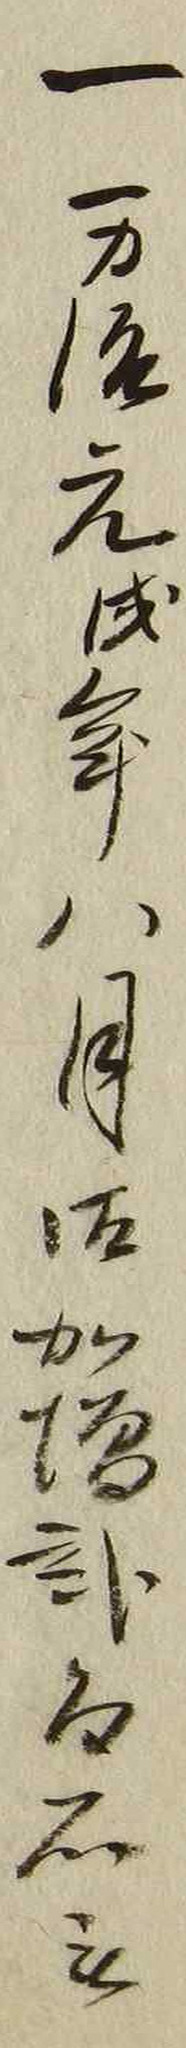一万治元戌年八月御加増弐百石被
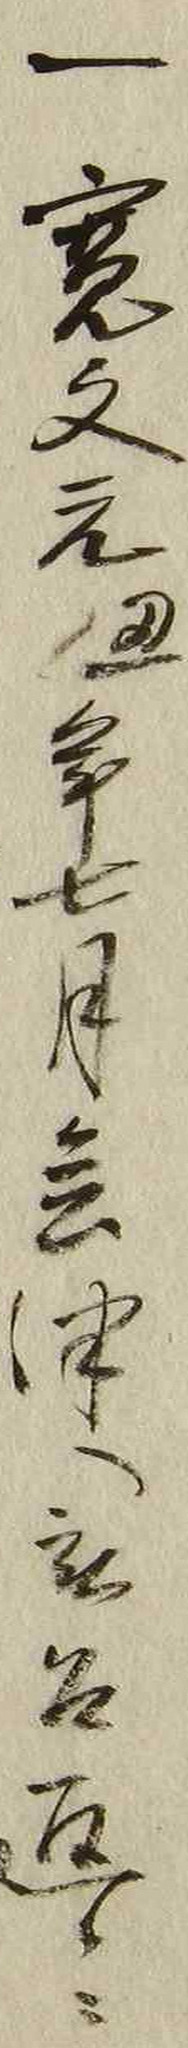一寛文元丑年七月会津へ被召返候ニ
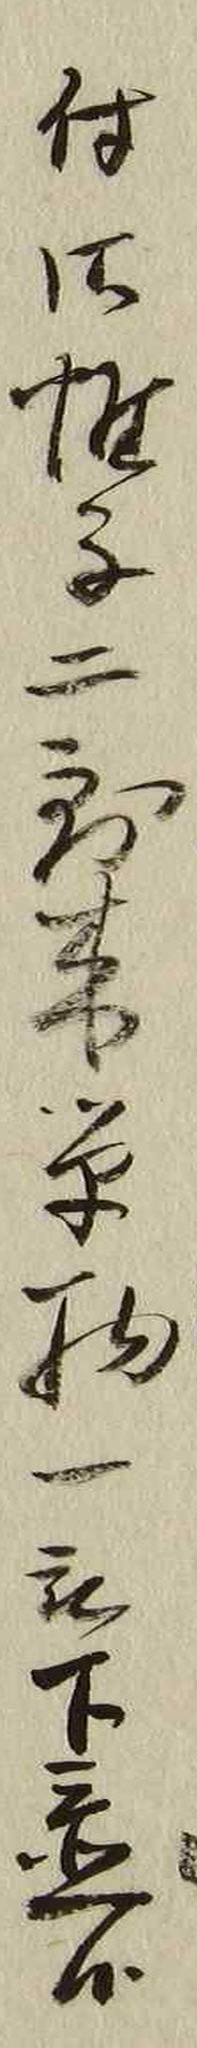付御帷子二到来単物一被下置候
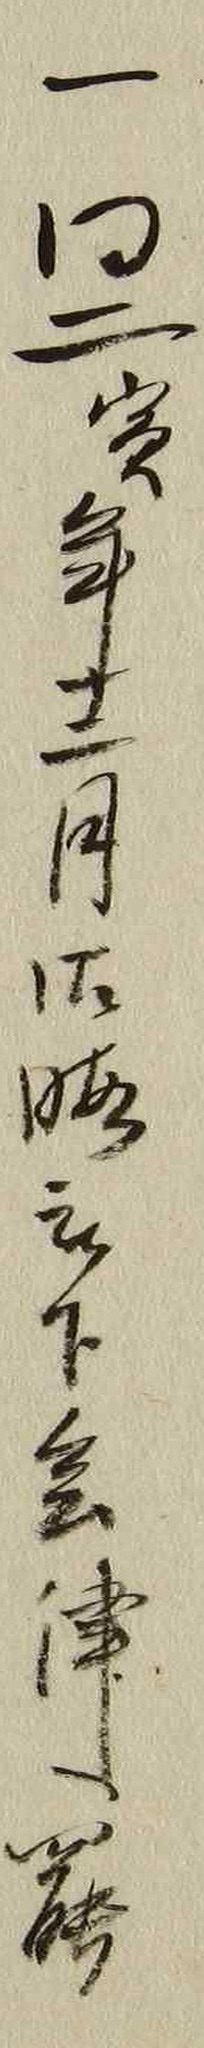一同二寅年十二月御暇被下会津へ罷
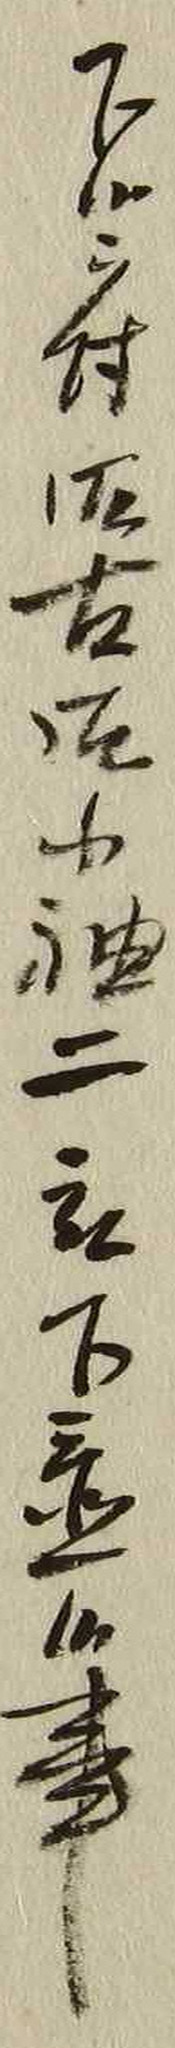下候ニ付御古御小袖二被下置候事
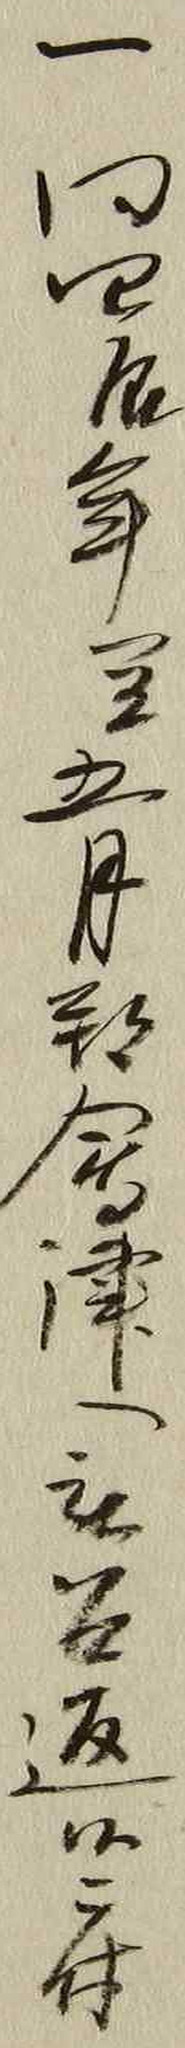一同四辰年閏五月朔会津へ被召返候ニ付
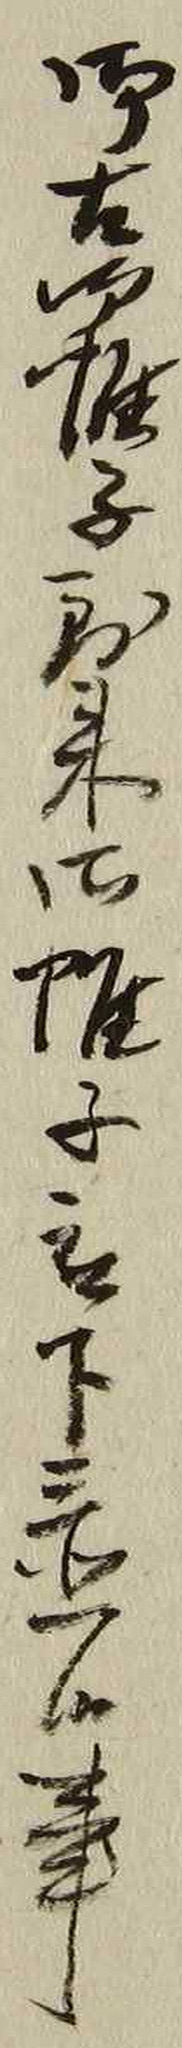御古御帷子到来御帷子被下置候事
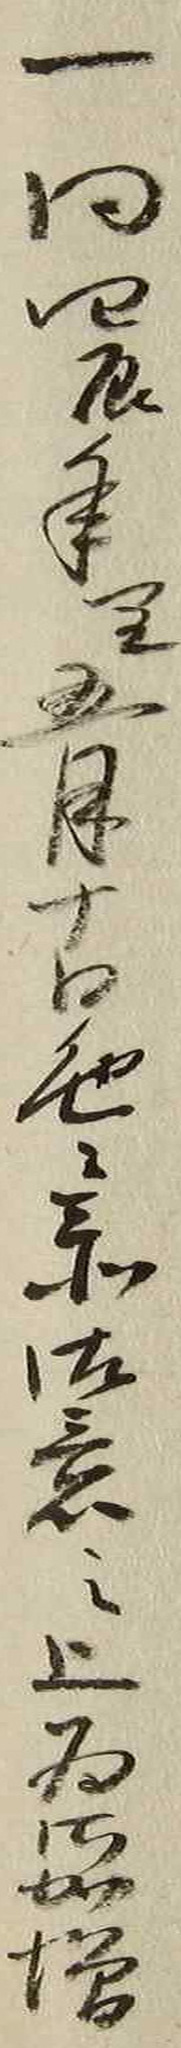一同四辰年閏五月十日色々忝御意之上為御加増
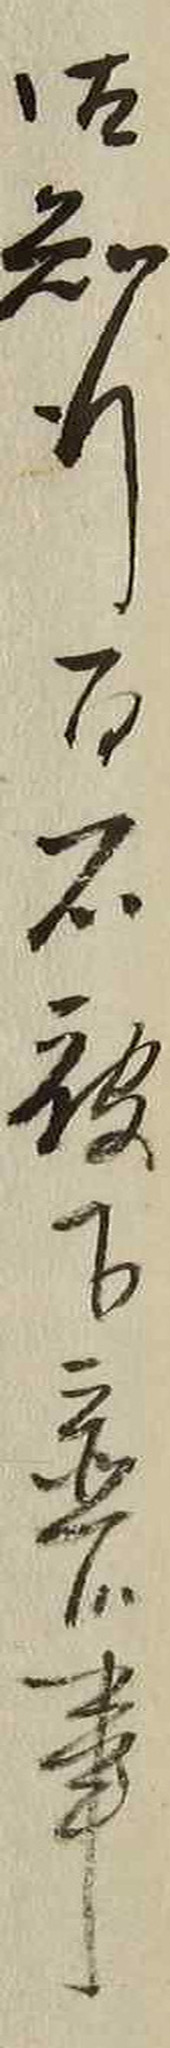御知行百石被下置候事
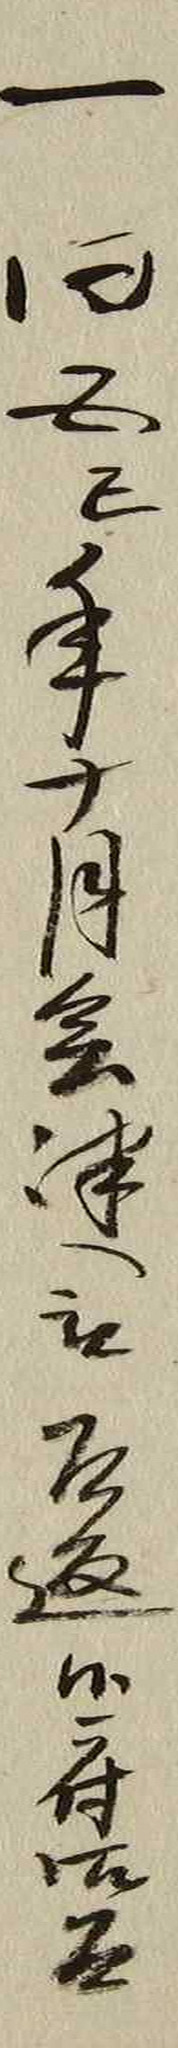一同五巳年十月会津へ被召返候ニ付御召
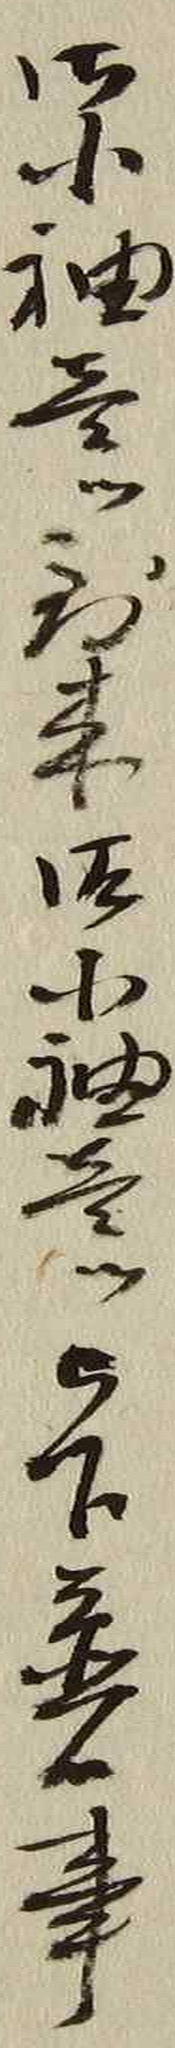御小袖壱ツ到来御小袖壱ツ被下置候事
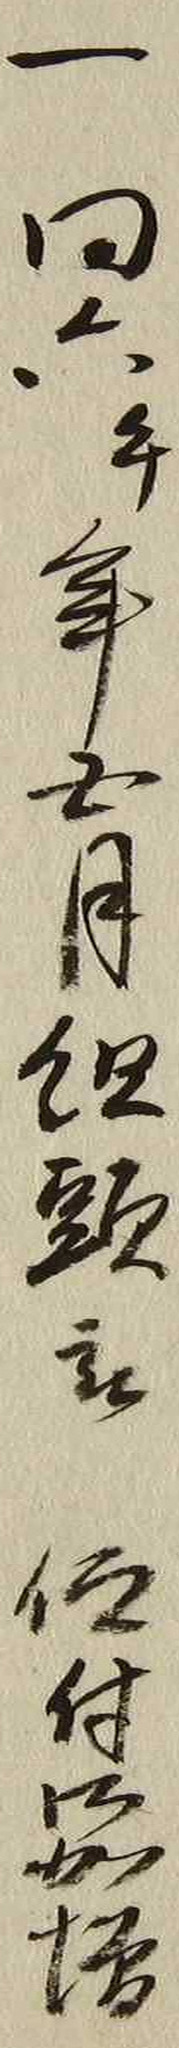一同六午年五月組頭被仰付御加増
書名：諸士系譜　巻之351　す之部1
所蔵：会津若松市立会津図書館
